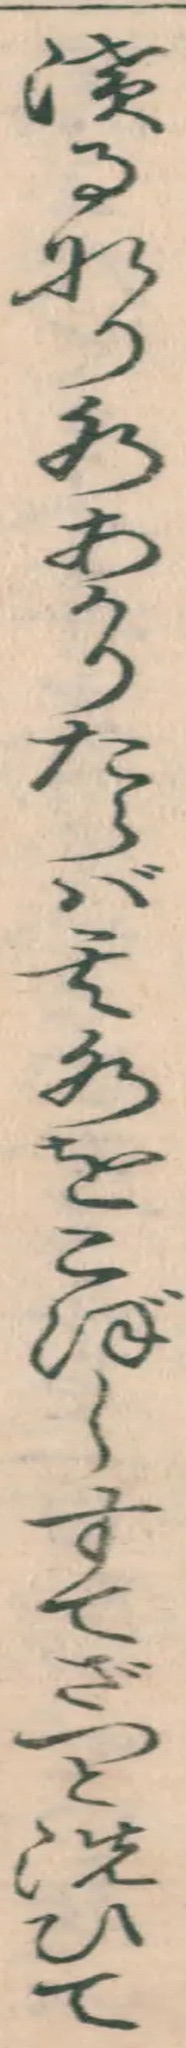漬るなり水あかりたらば其水をこぼしすてざつと洗ひて
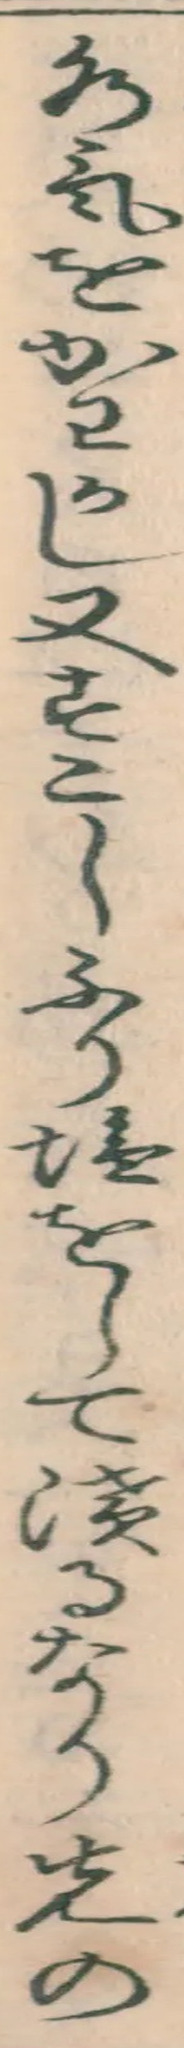水気をかわかし又すこしふり塩をして漬るなり先の
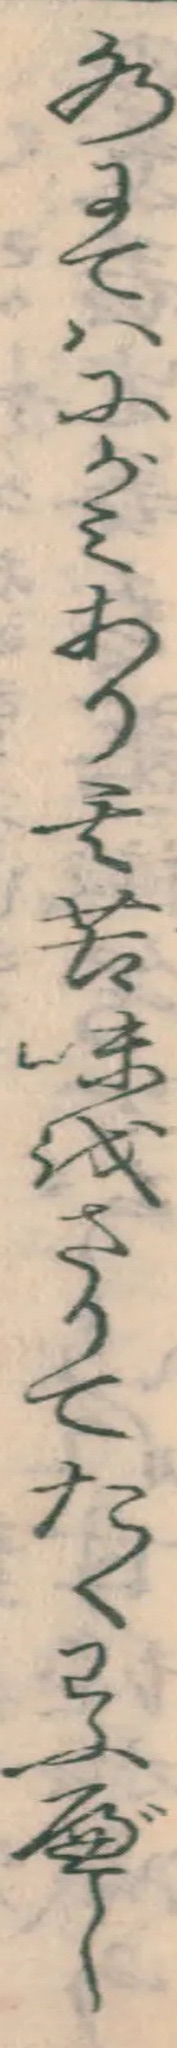水にてはにがみあり其苦味をさりてたくわふべし
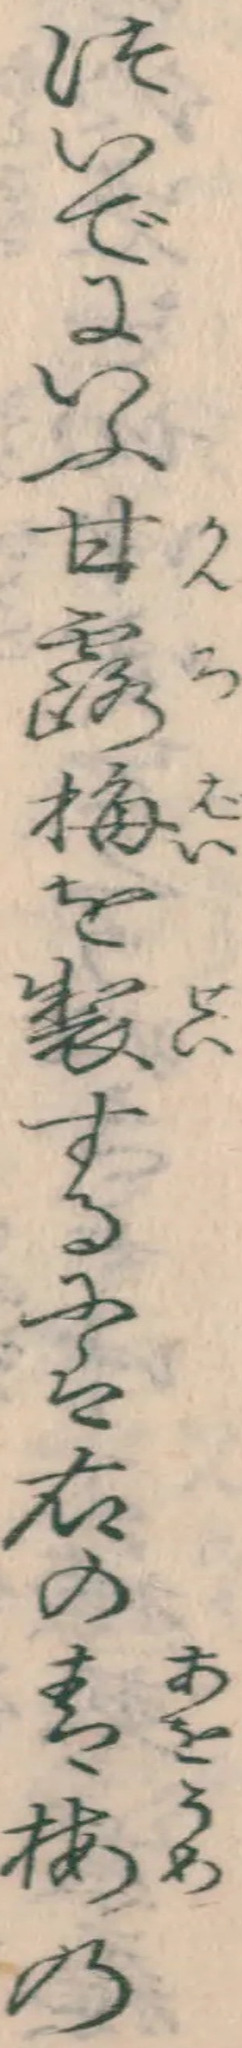ついでにいふ甘露梅を製するには右の青梅の
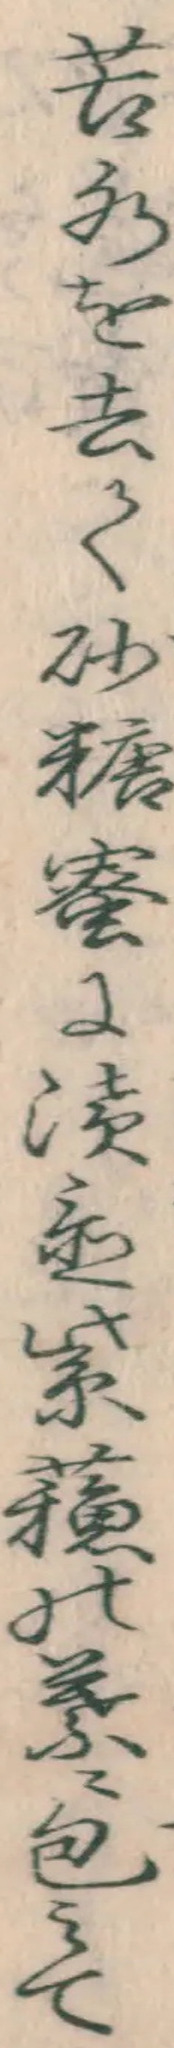苦水を去て砂糖蜜に漬置紫蘇の葉に包みて
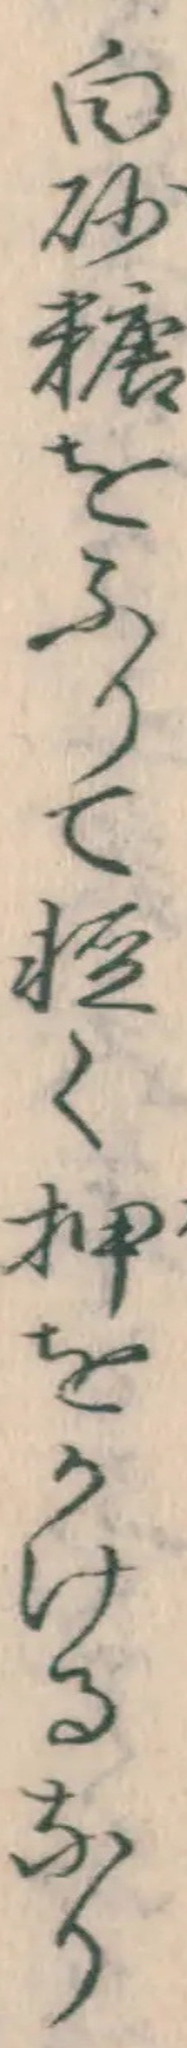白砂糖をふりて軽く押をかけるなり
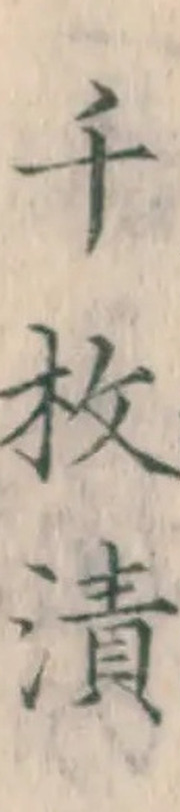千枚漬
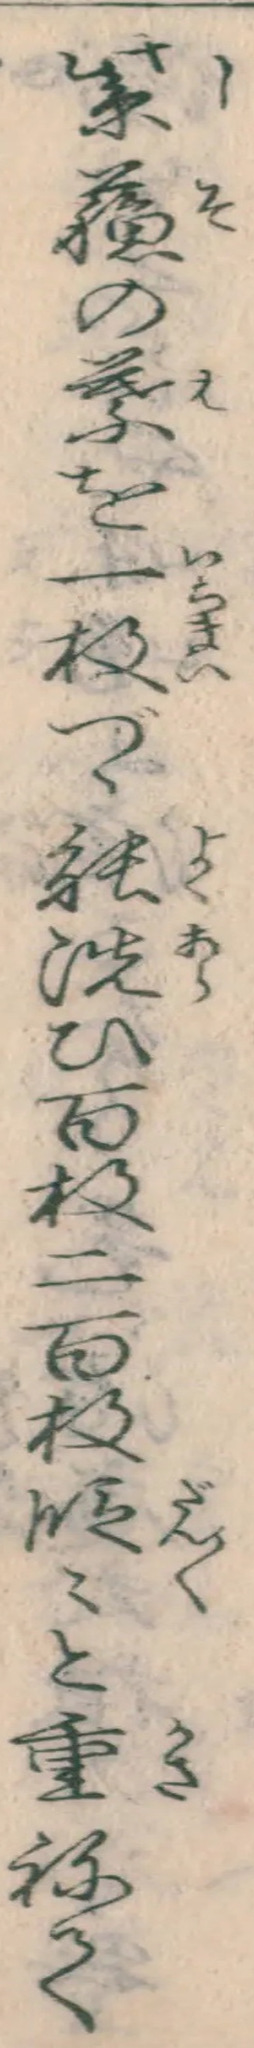紫蘇の葉を一枚づゝ能洗ひ百枚二百枚段々と重ねて
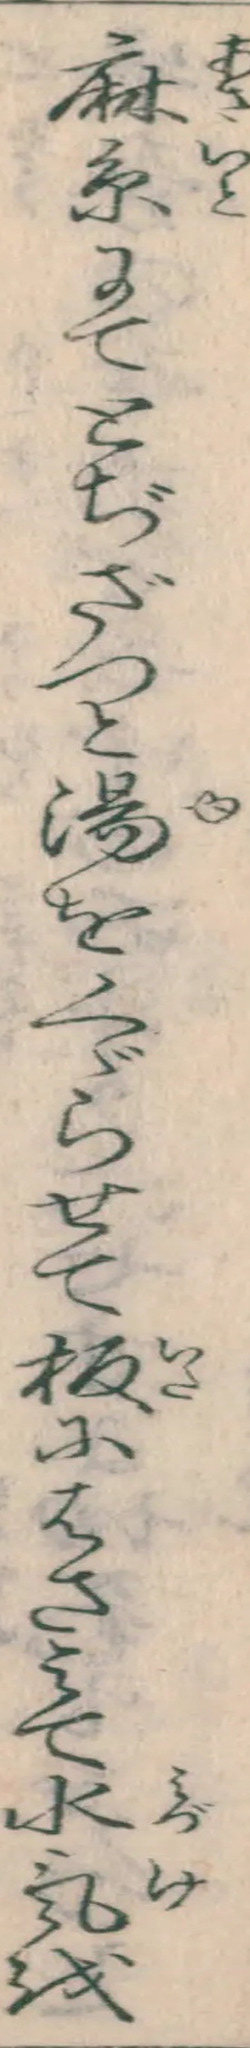麻糸にてとぢざつと湯をくゞらせて板にはさみて水気を
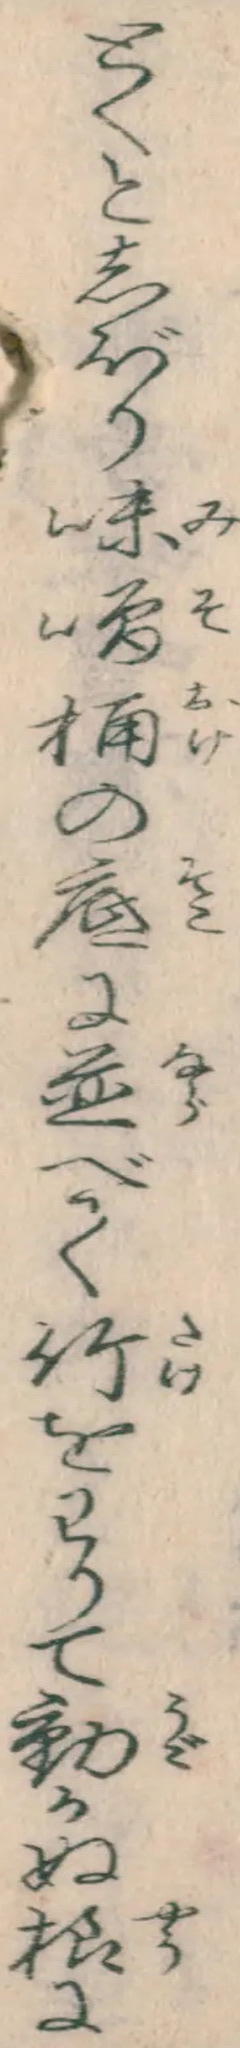とくとしぼり味噌桶の底に並べて竹をわりて動かぬ様に
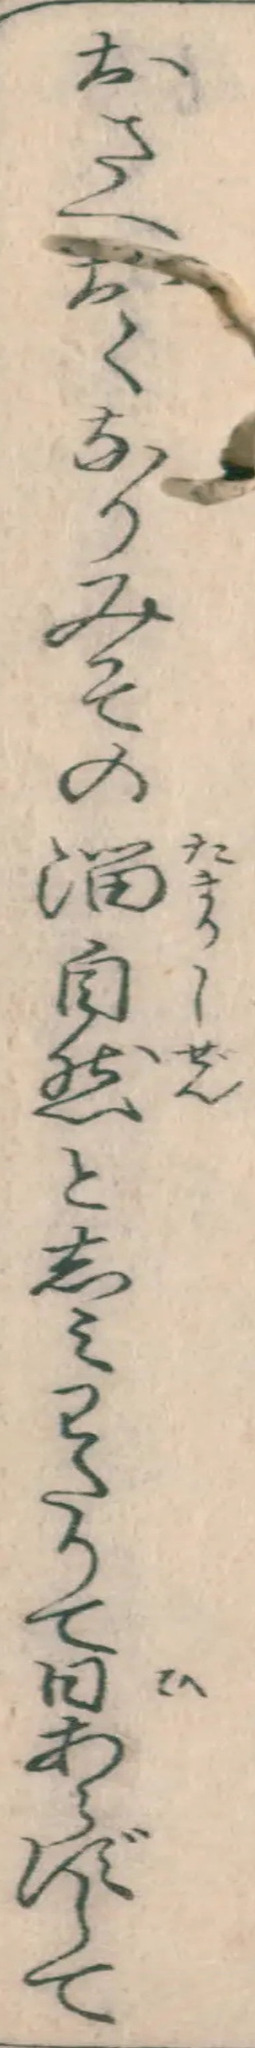おさへおくなりみその溜自然としみわたりて日あらずして

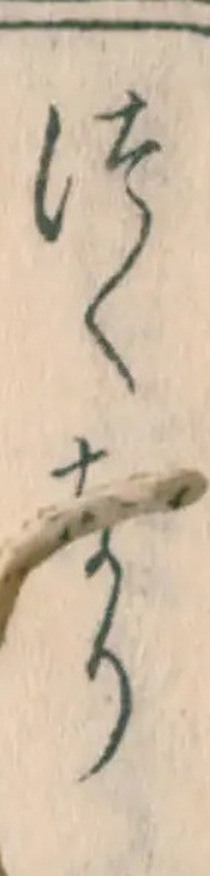つくなり
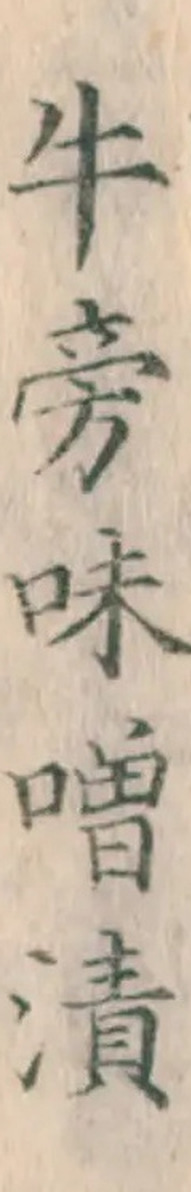牛旁味噌漬
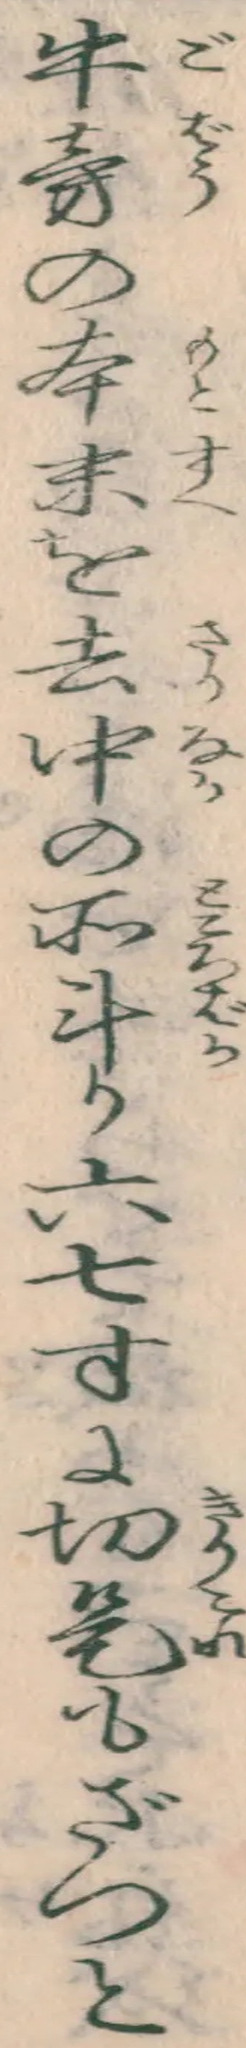牛旁の本末を去中の所斗り六七寸に切是もざつと
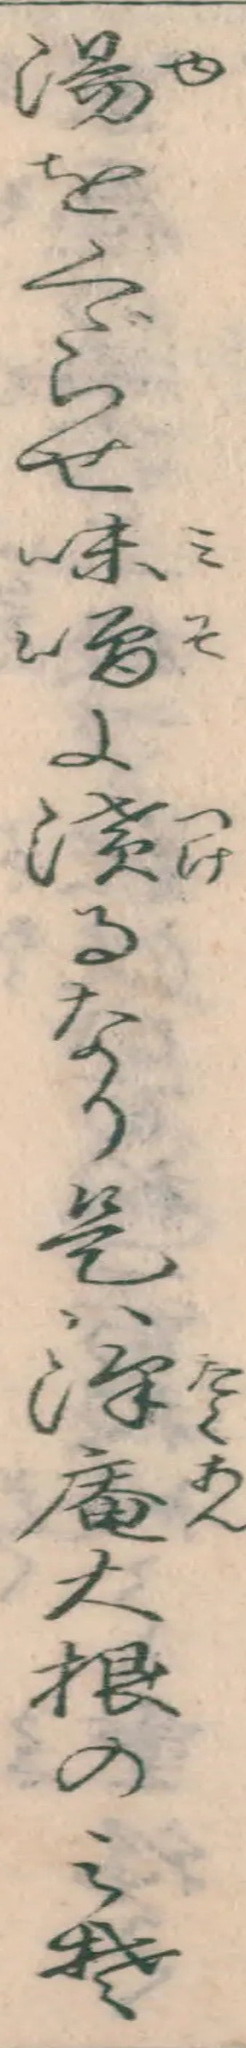湯をくゞらせ味噌に漬るなり是は沢庵大根のみそ
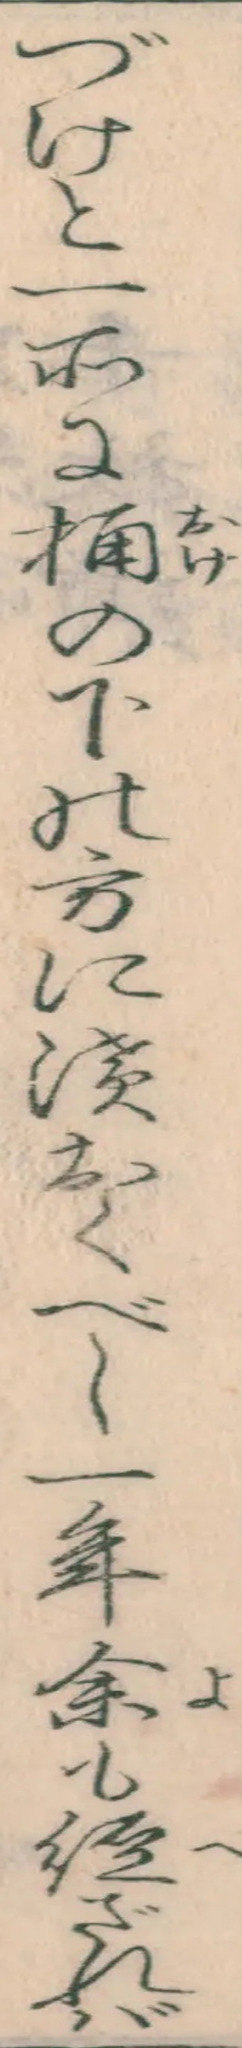づけと一所に桶の下の方に漬おくべし一年余も経ざれば
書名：四季漬物鹽嘉言
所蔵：国立国会図書館 National Diet Library, JAPAN
